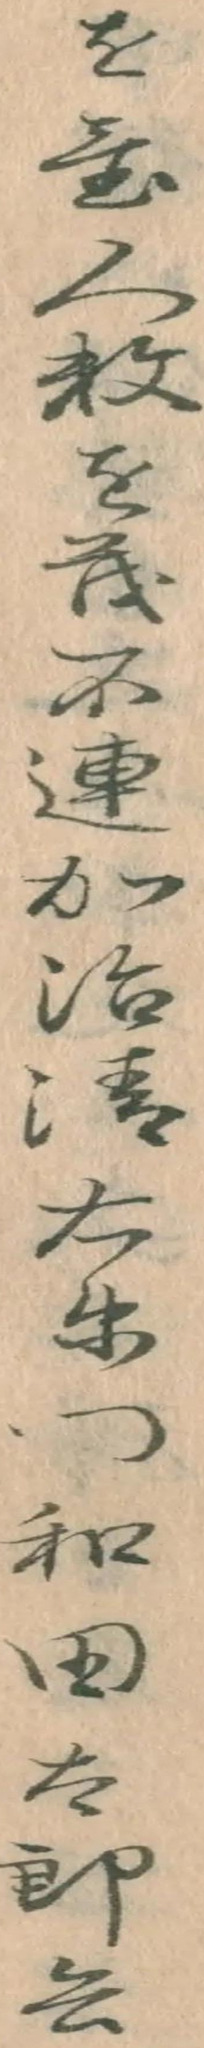を置人数を茂不連加治清右衛門和田太郎兵
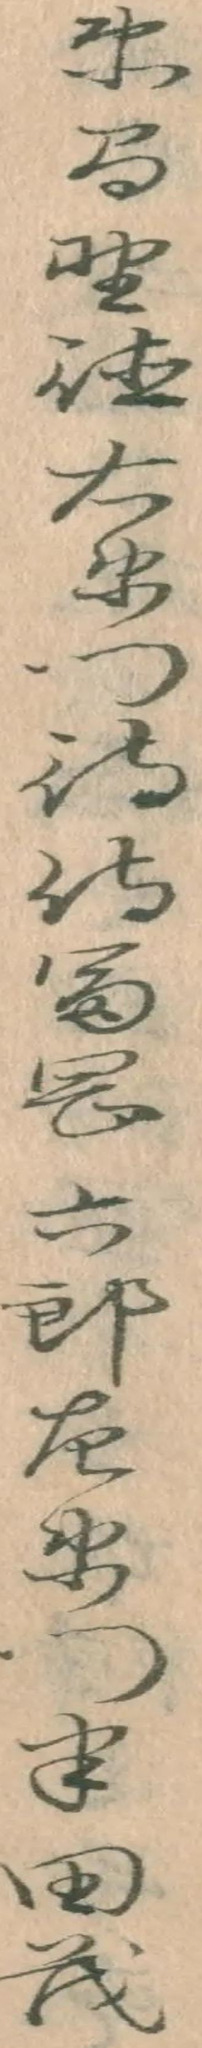衛間野徳右衛門待侍冨岡六郎左衛門半田茂
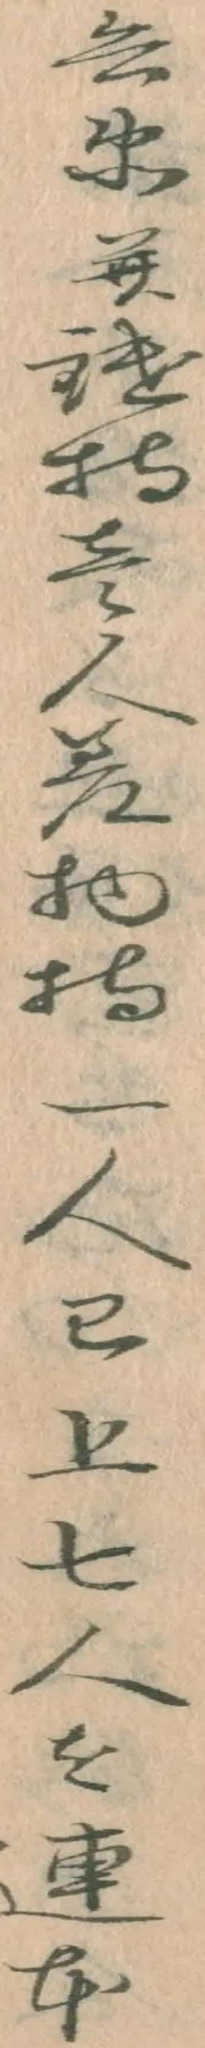兵衛幷鑓持壱人差物持一人已上七人を連本
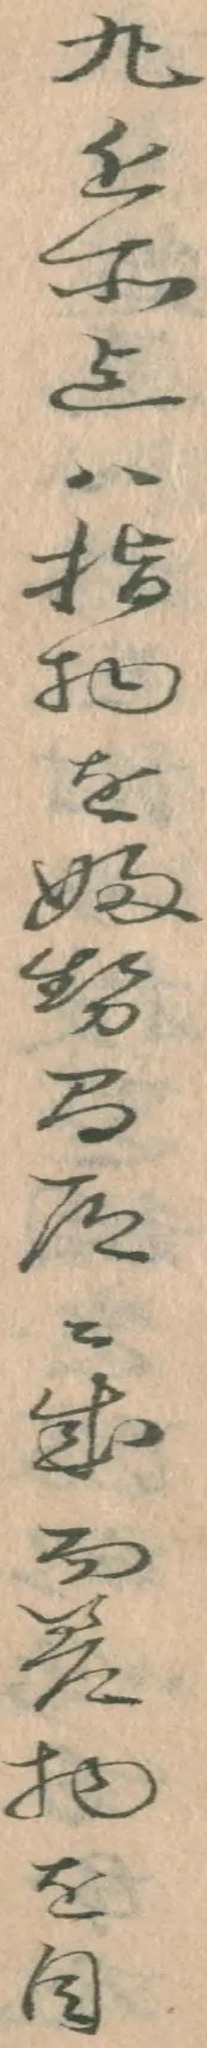丸近所迄は指物を婦勢間道に成而差物を自
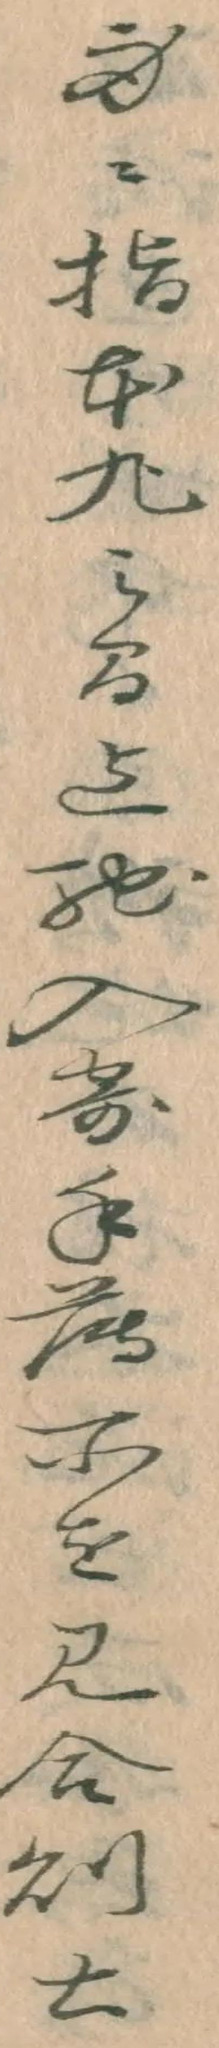身に指本丸之間迄馳入寄手薄所を見合則土
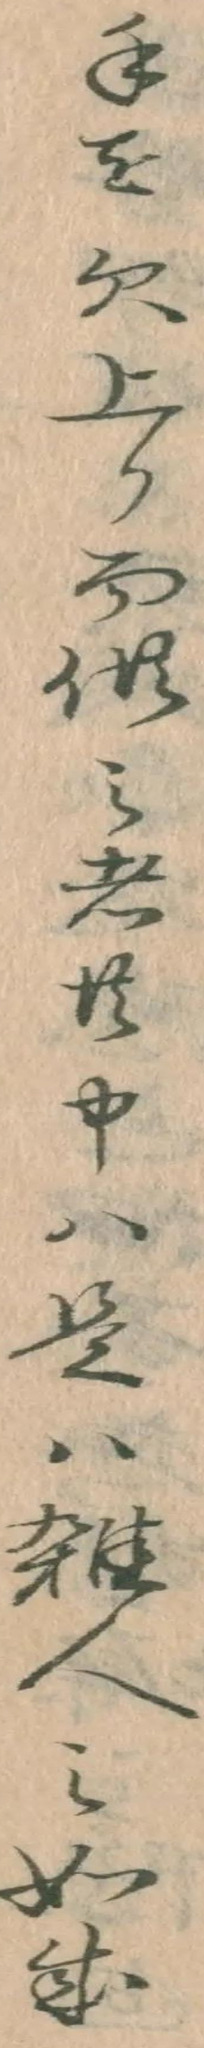手を欠上り而供之者共申は是は雑人之如成
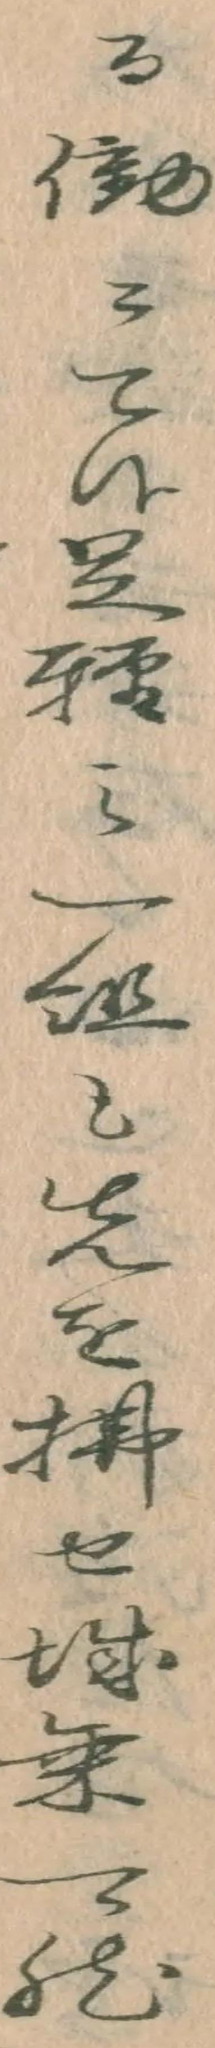る働にて候足軽之一組も先を払せ城乗可然
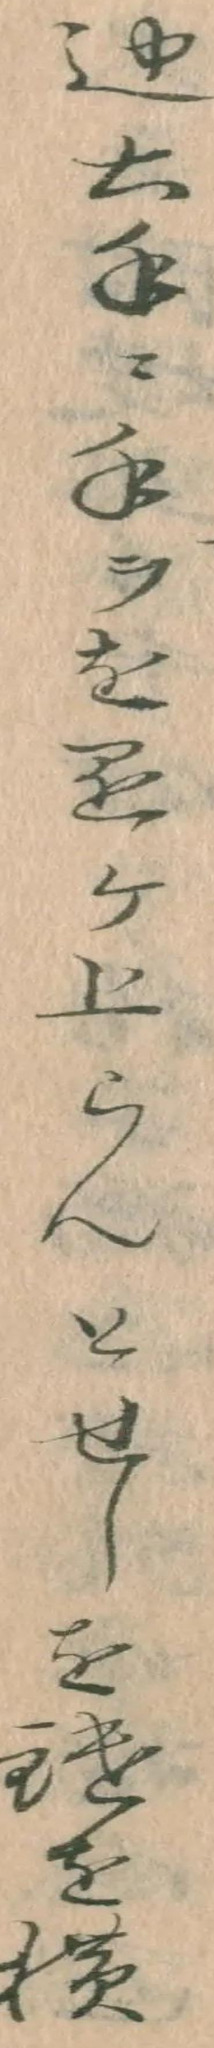迚土手に手ヲを懸け上らんとせしを鑓を横
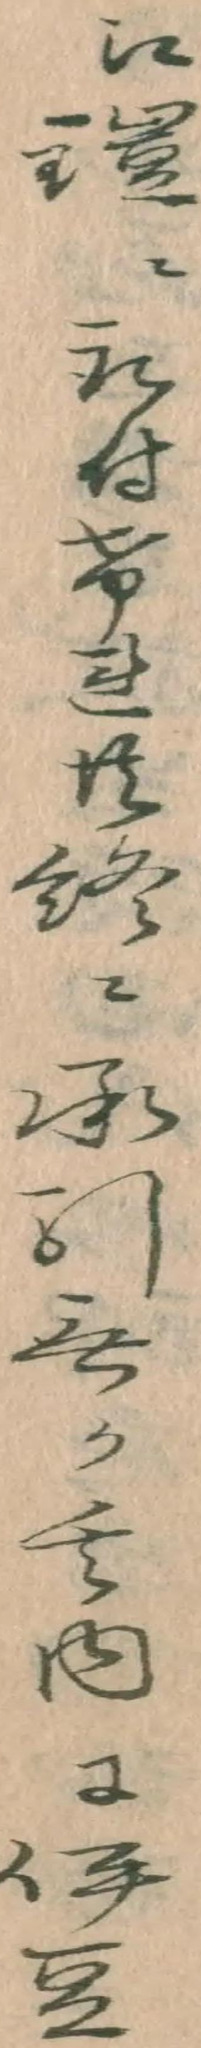江鎧に取付希連共終に承引無か其内尓伊豆
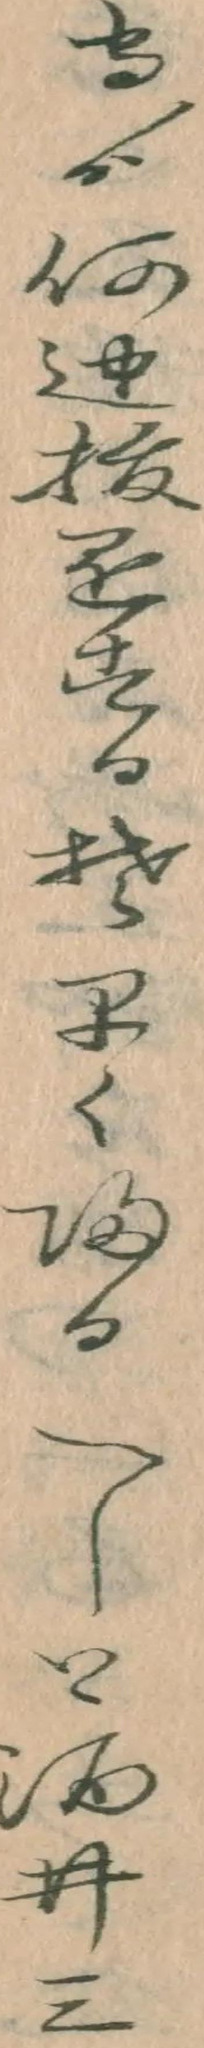守ゟ何迚抜懸春る楚早く帰るへしと酒井三
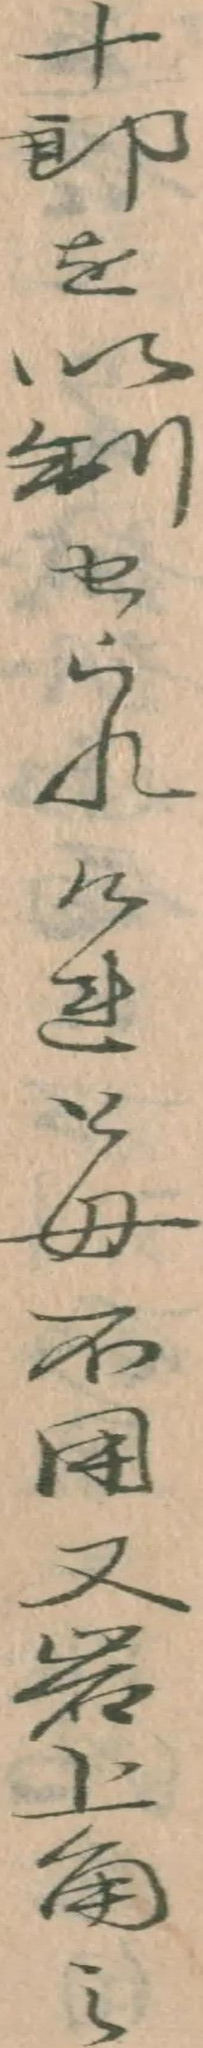十郎を以制せられけ連と母不用又岩上角之
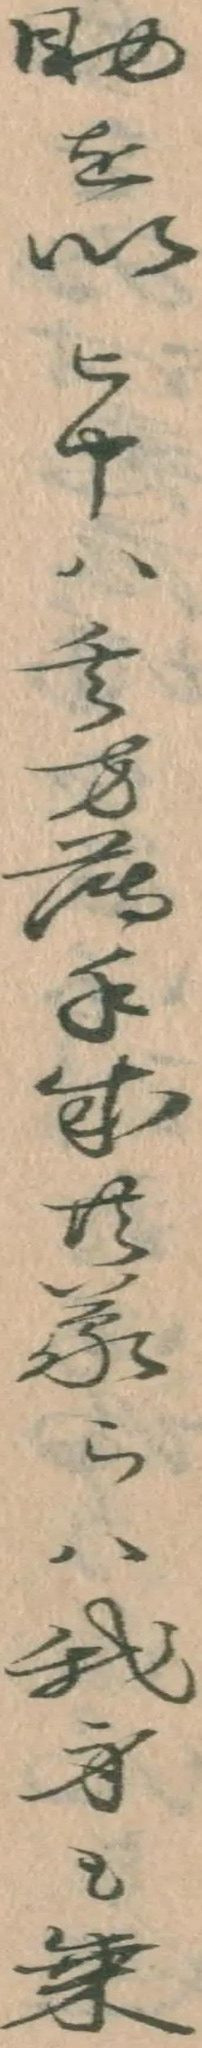助を以被申は其方薄手成共承らは我身も乗
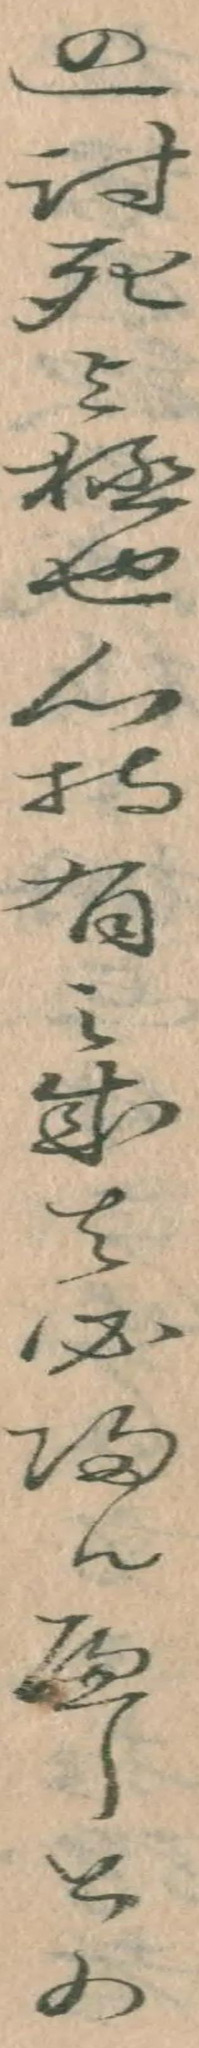込討死与極也心持有之成者必帰る扁しとの
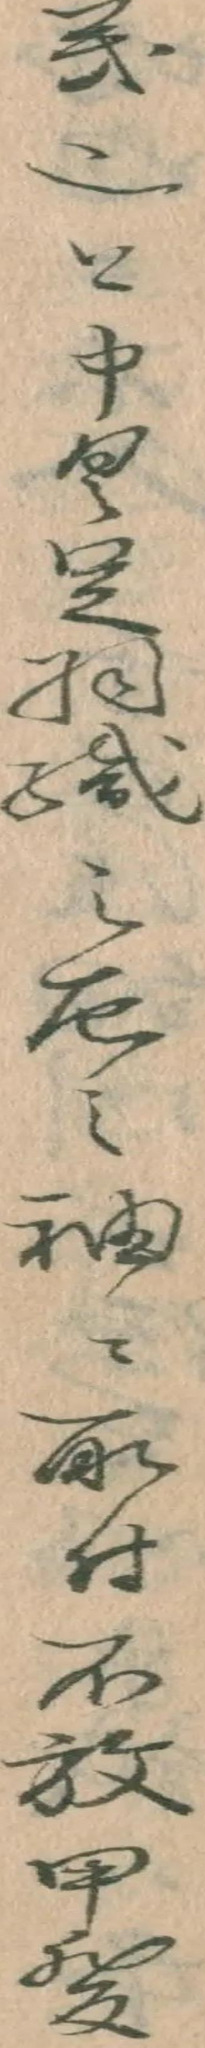義也と申具足羽織之左之袖に取付不放甲斐
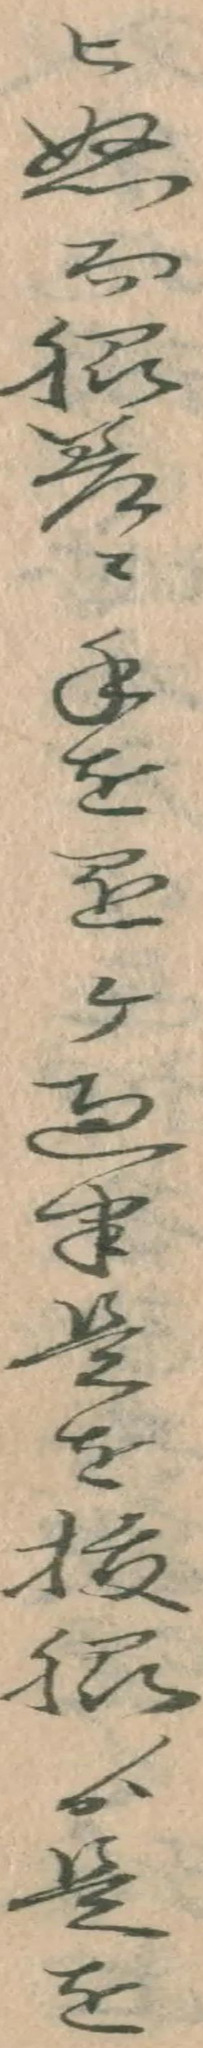被怒而脇差に手を懸け過半是を抜脇ゟ是を
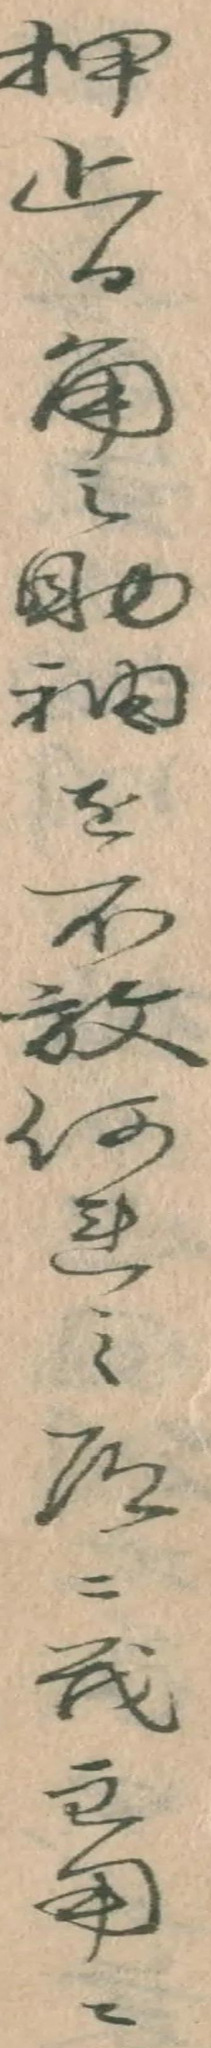押止る角之助袖を不放何連之道に茂主用に
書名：切支丹御退治記 49巻. [8]
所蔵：国立国会図書館 National Diet Library, JAPAN
